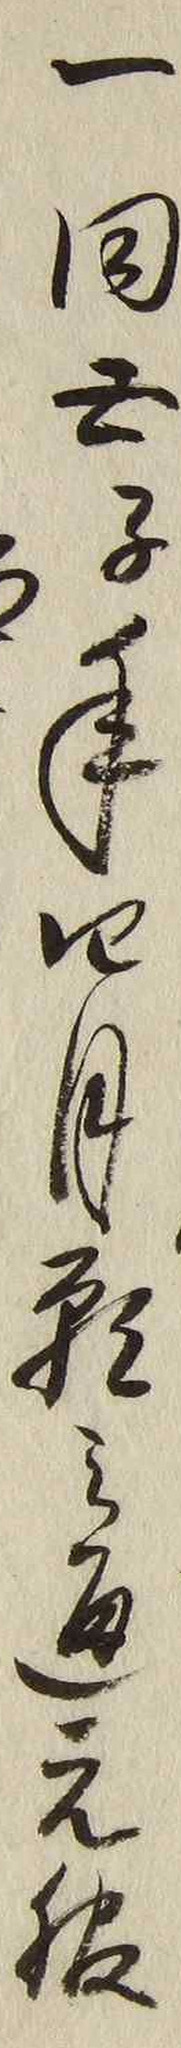一同五子年四月願之通元服
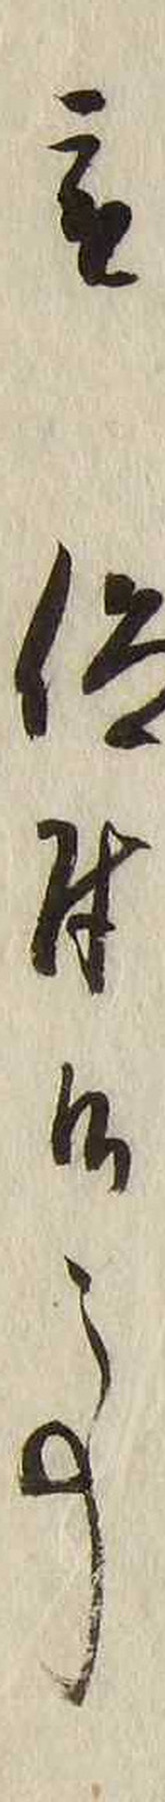被仰付候事

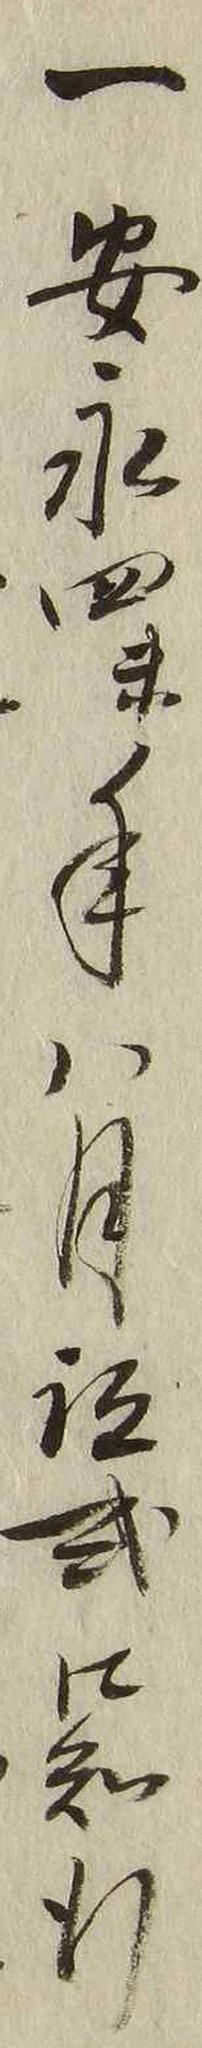一安永四未年八月跡式御知行
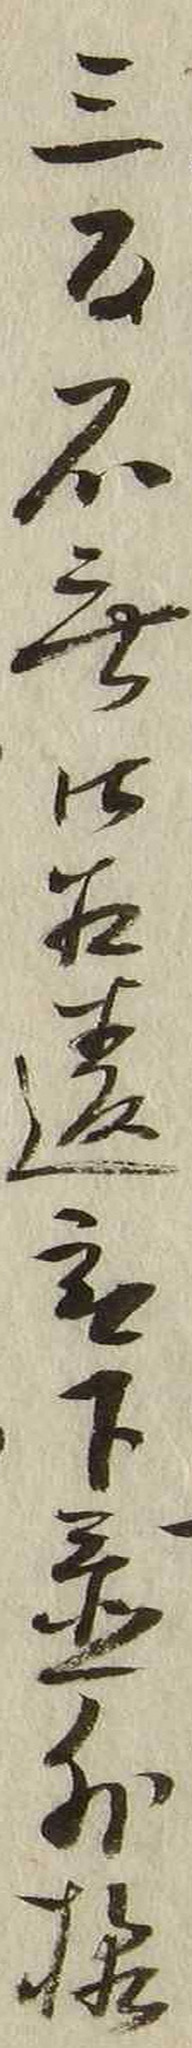三百石無御相違被下置外様
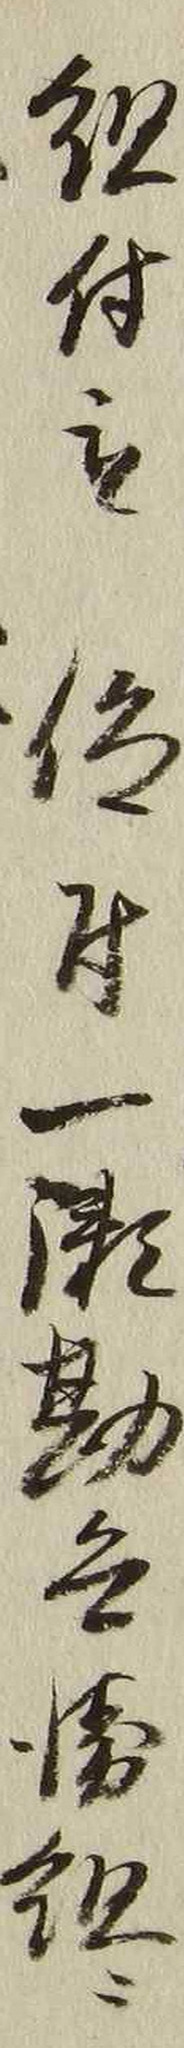組付被仰付一瀬勘兵衛組ニ
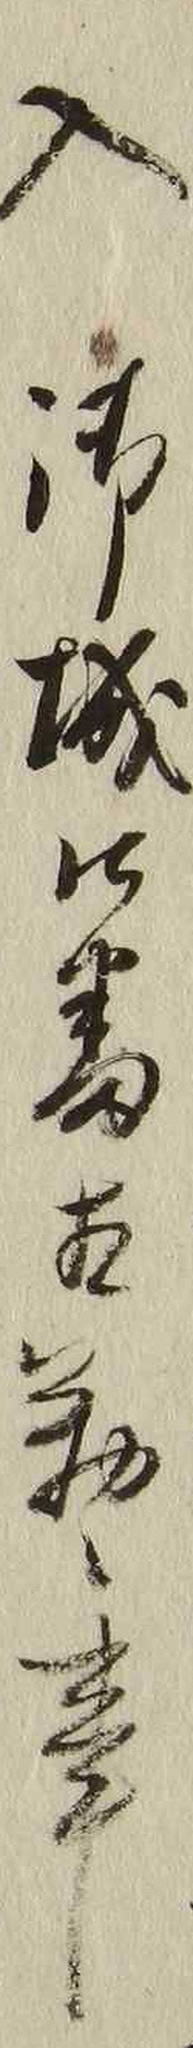入御城御番相勤候事
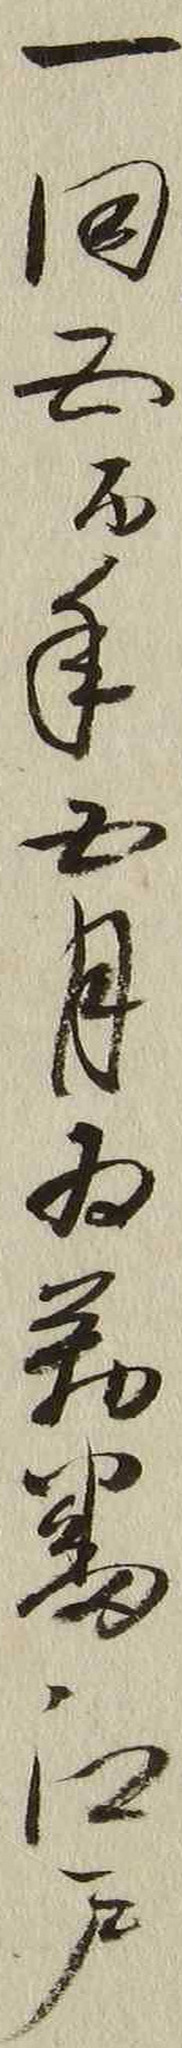一同五酉年五月為勤番江戸
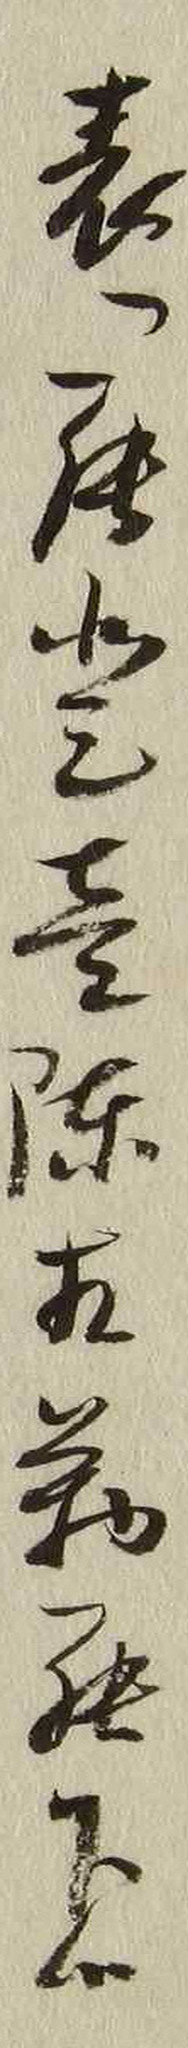表へ罷登壱陣相勤罷下候
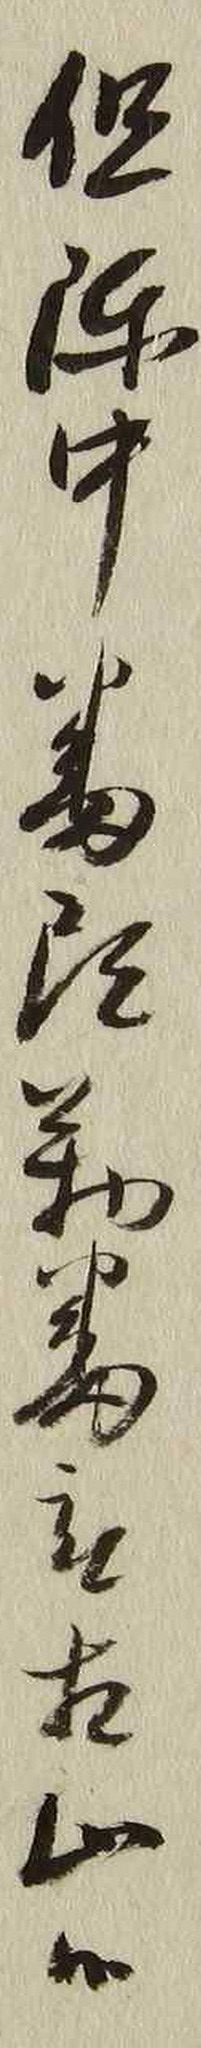但陣中番頭勤番被相止候
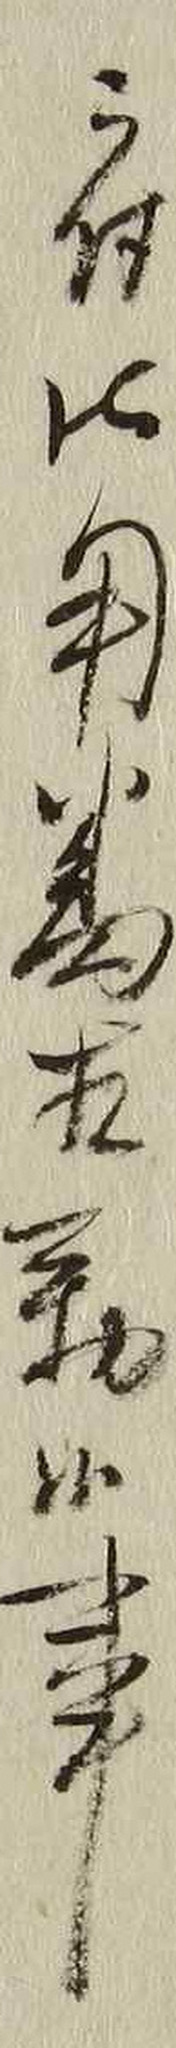ニ付御用番相勤候事
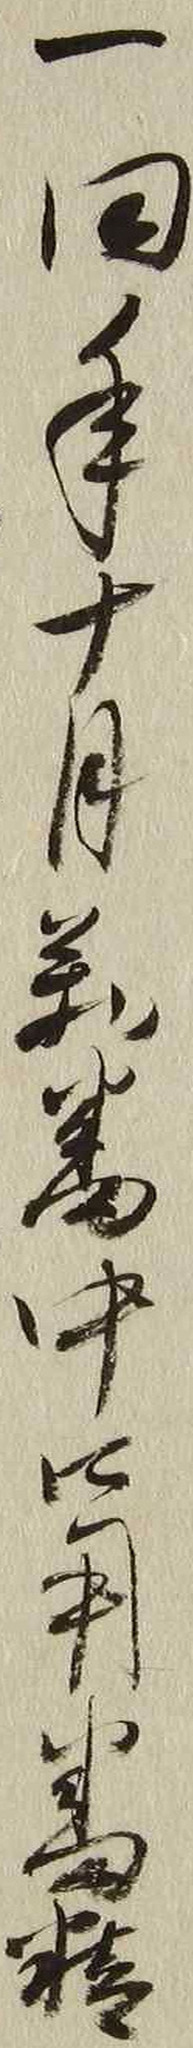一同年十月勤番中御用番精
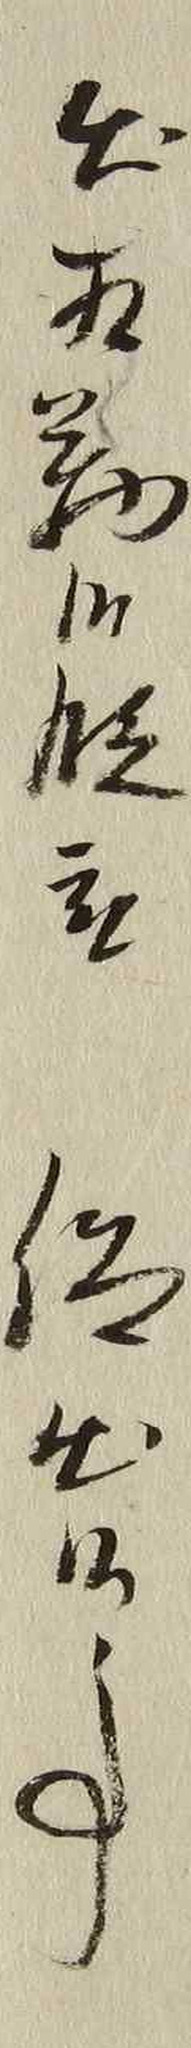出相勤候段被仰出候事
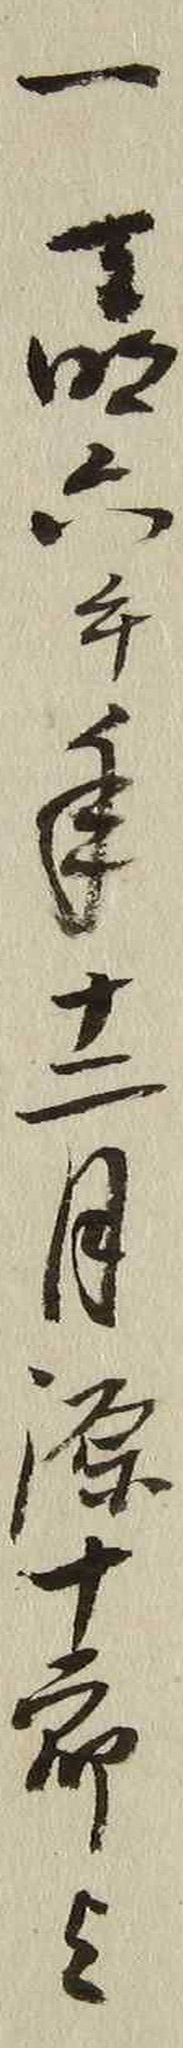一天明六午年十二月源十郎与
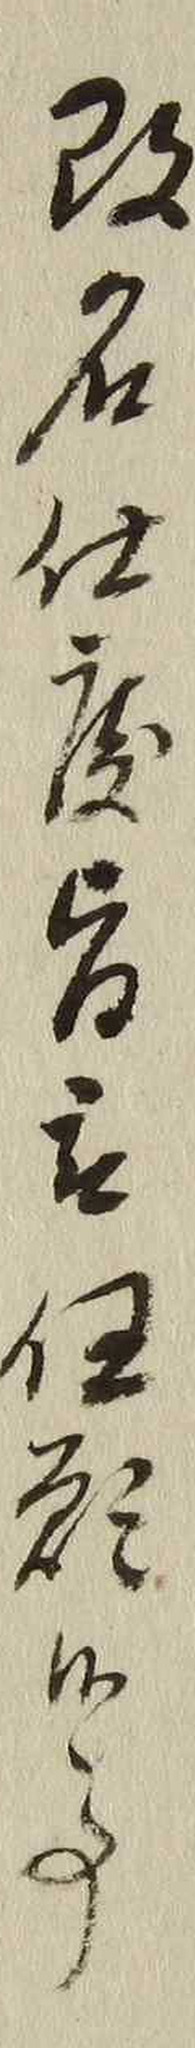改名仕度旨被任願候事
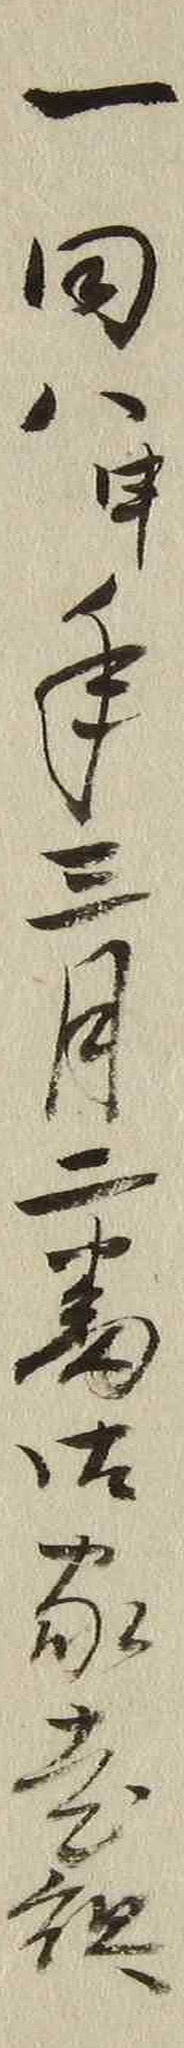一同八申年三月二番御家老組へ
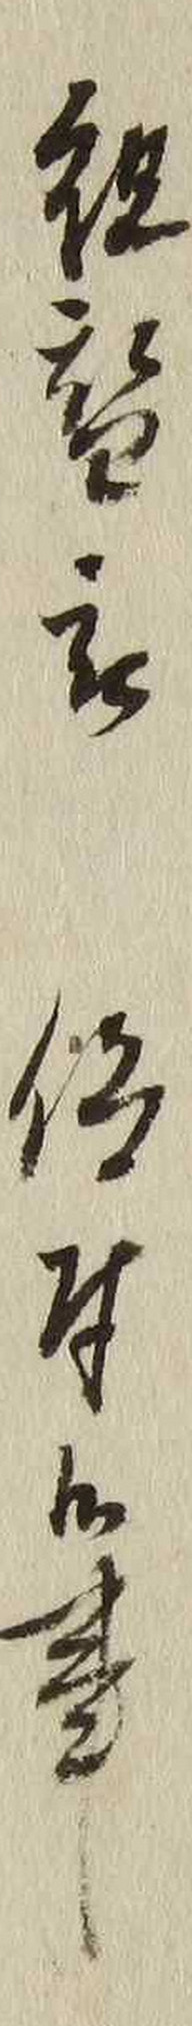組替被仰付候事
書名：諸士系譜　巻之355　す之部5
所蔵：会津若松市立会津図書館
